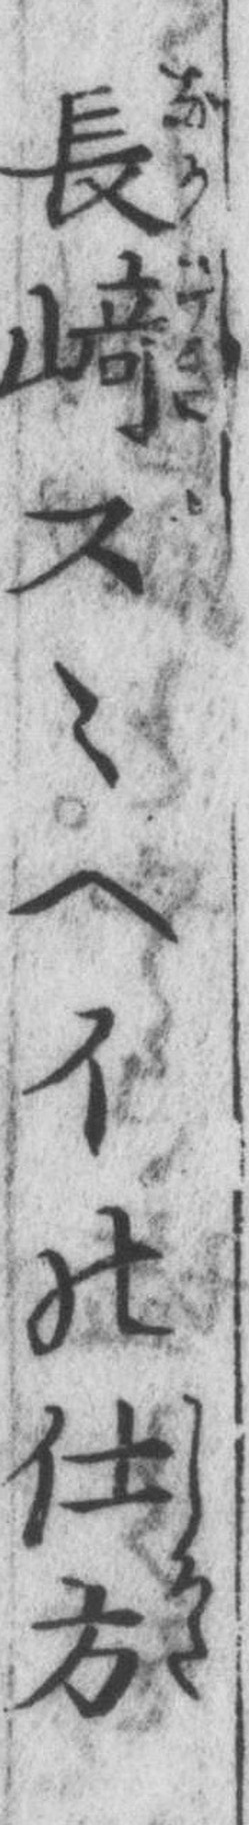長崎スヽヘイの仕方
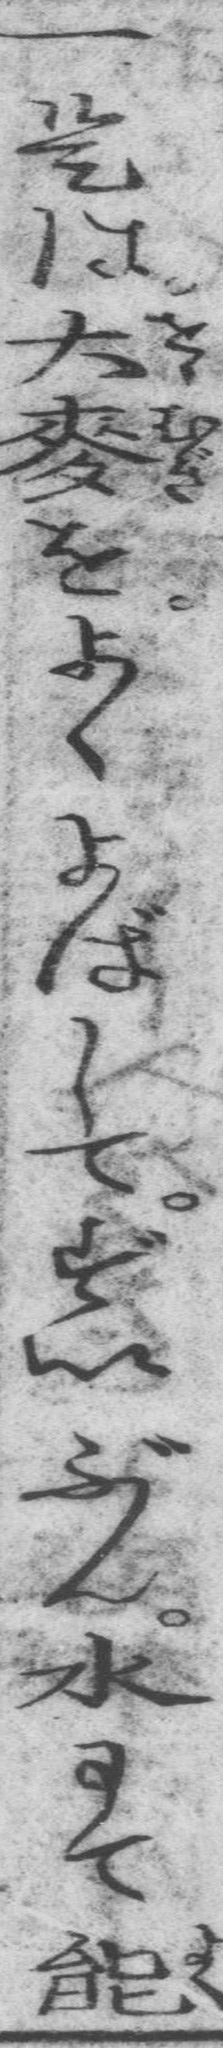一是は。大麦を。よくよばして。ずいぶん。水にて能

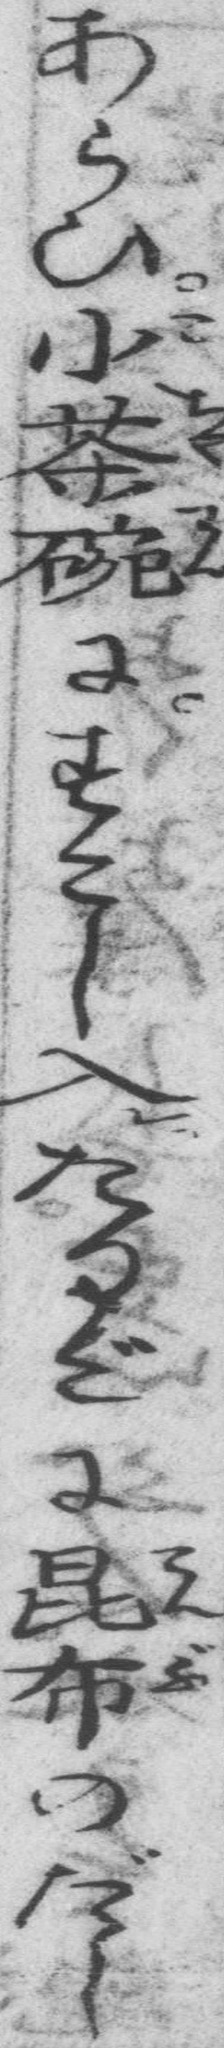あらひ。小茶碗に。すこし入れ。たまごに昆布のだし
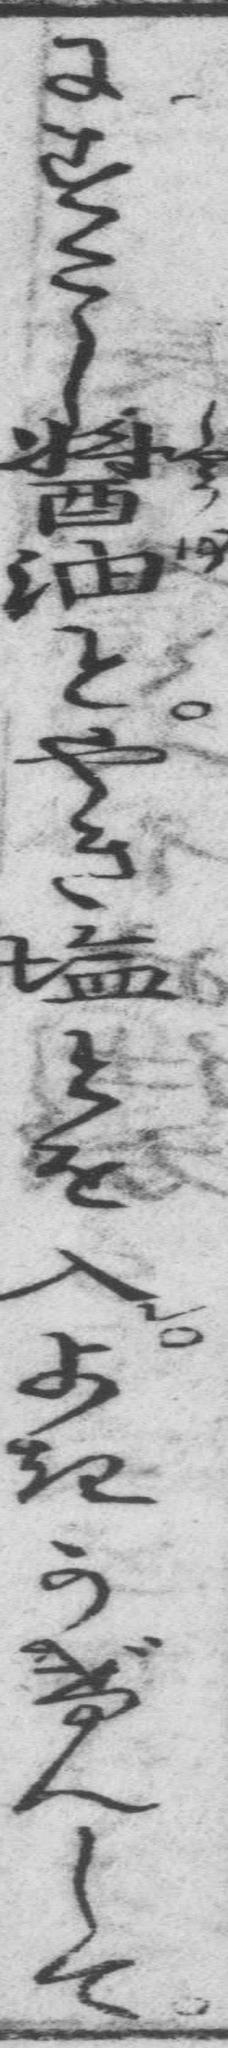に。すこし醤油と。やき塩とを入れ。よきかげんして。
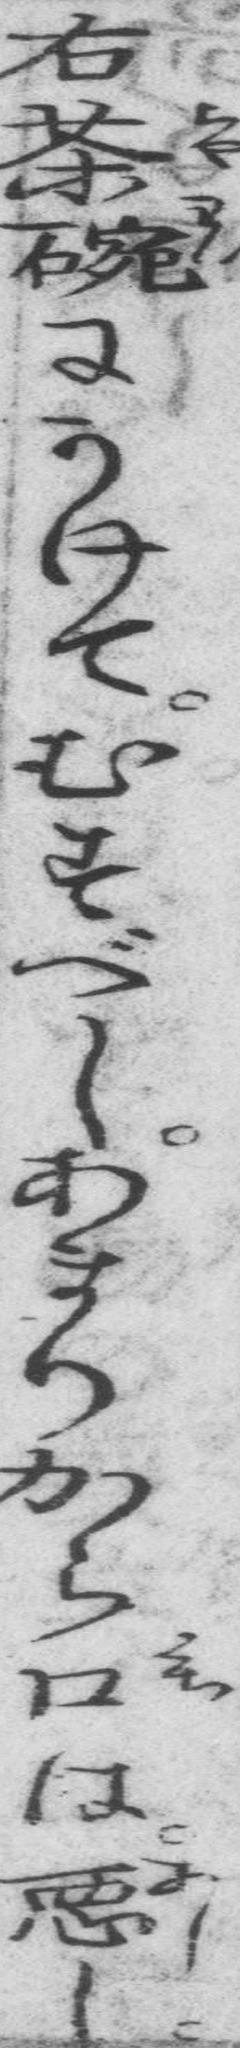右茶碗にかけて。むすべし。あまりから口は。悪し。
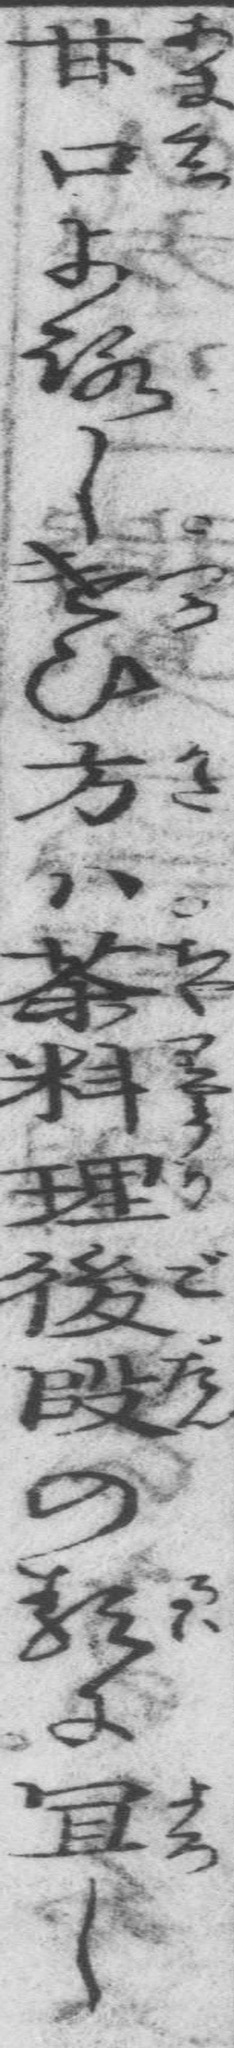甘口よろし。遣ひ方は。茶料理後段の類に宜し
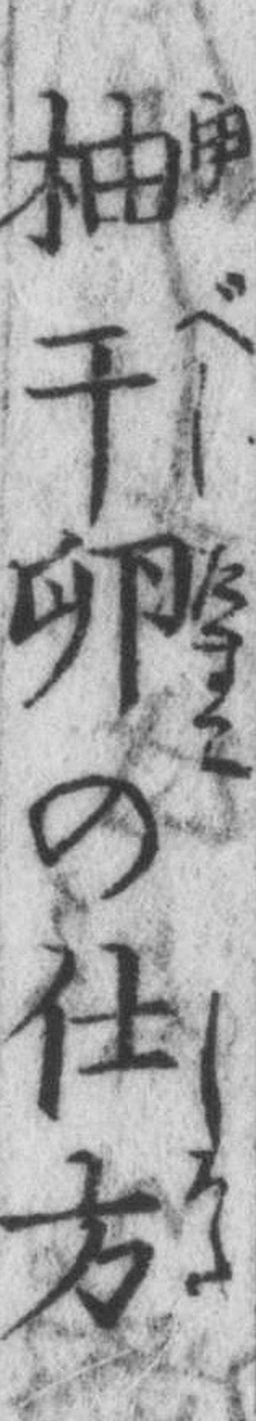柚干卵の仕方
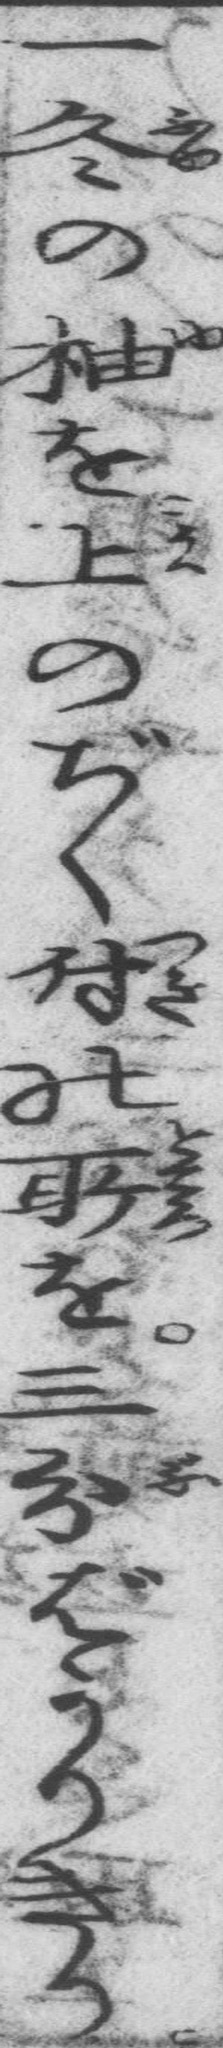一冬の柚を。上のぢく付の所を。三分はかりきり。
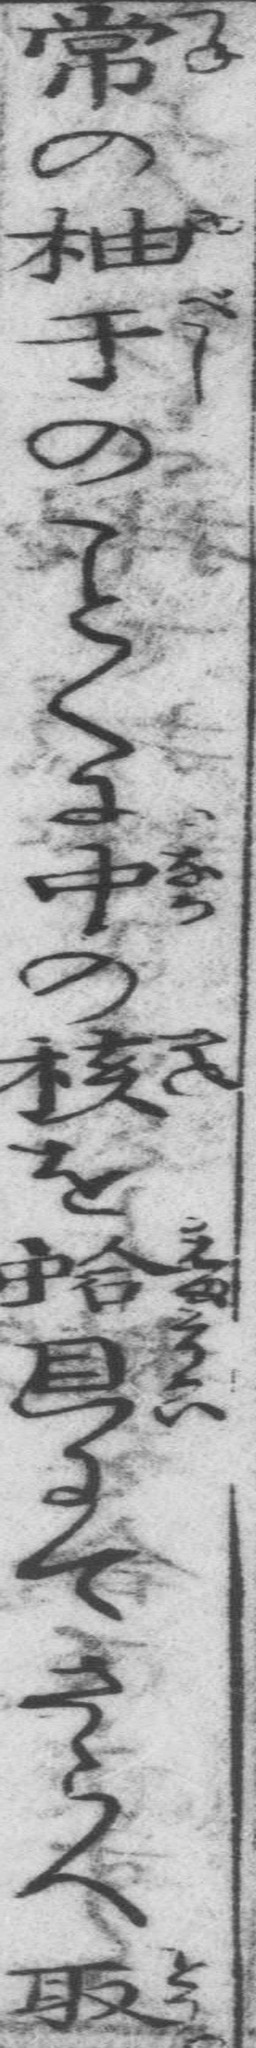常の柚干のことくに。中の核を蛤貝にてさらへ取。
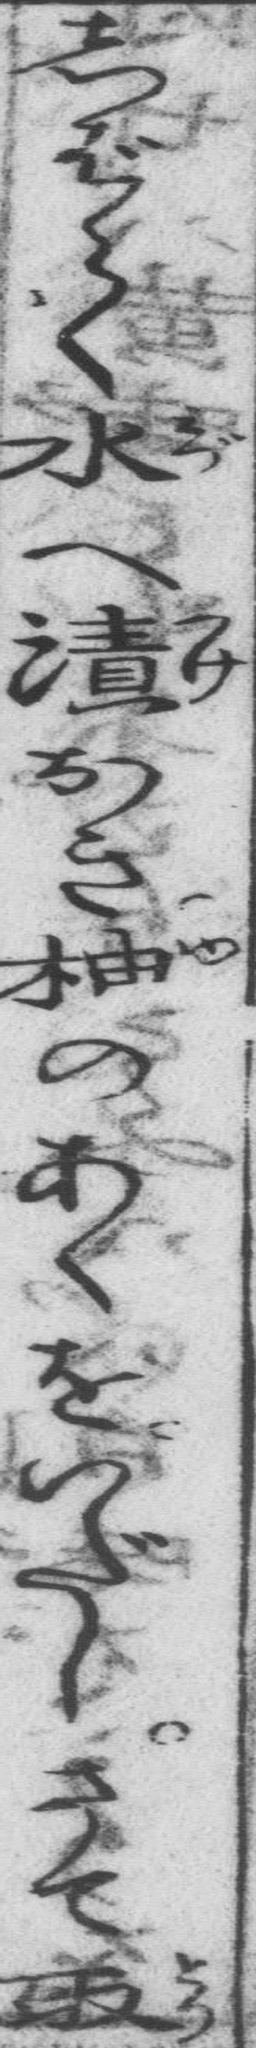しばらく水へ漬おき。柚のあくをいだし。さて取
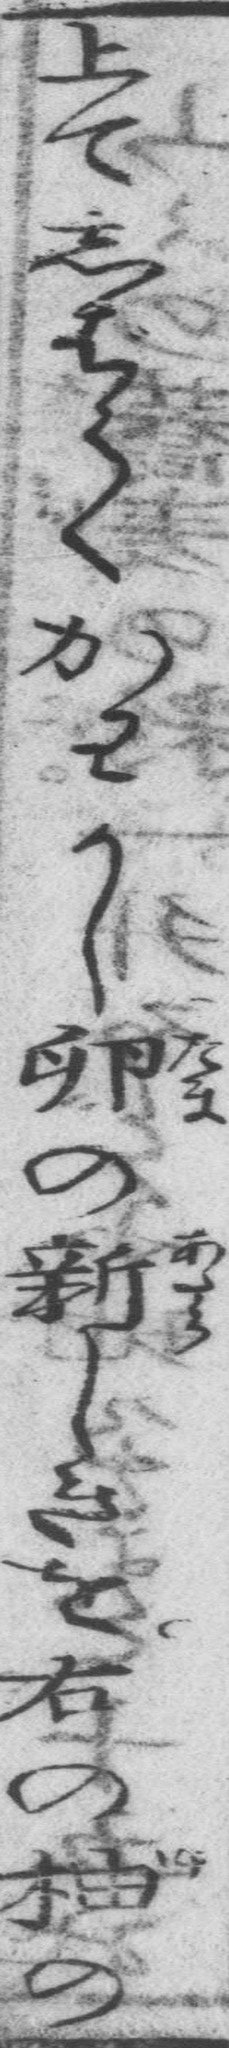上てしばらくかわかし。卵の新しきを。右の柚の
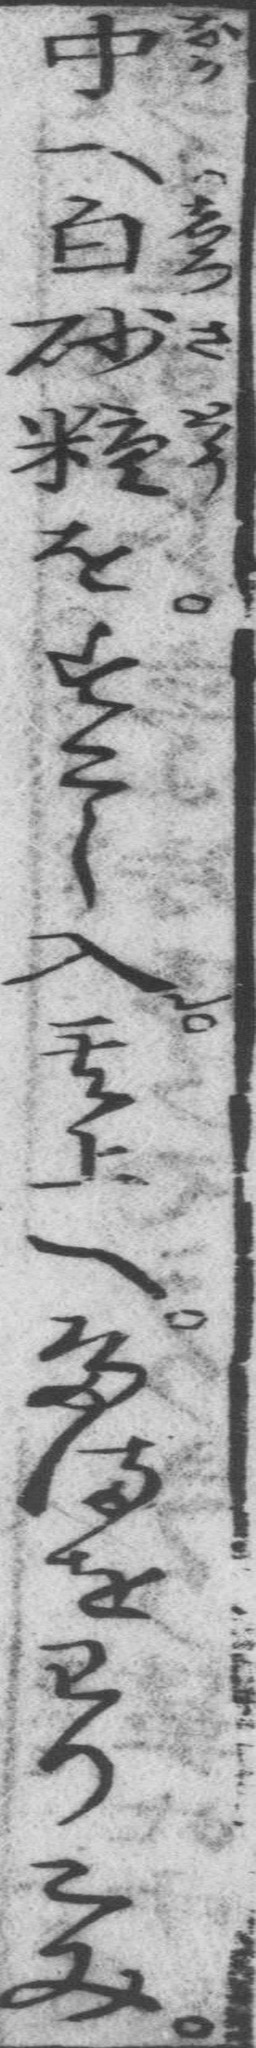中へ。白砂糖を。すこし入れ。其上へ。たまをわりこみ。
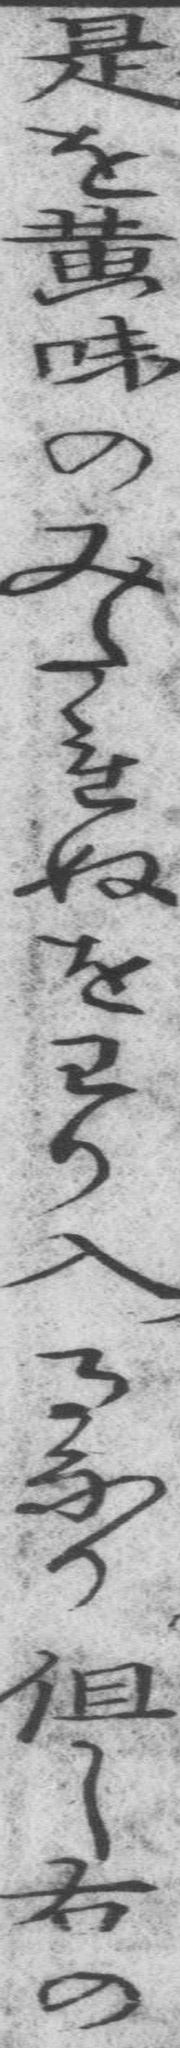是を黄味のみたれぬを。わり入れるなり。但し右の
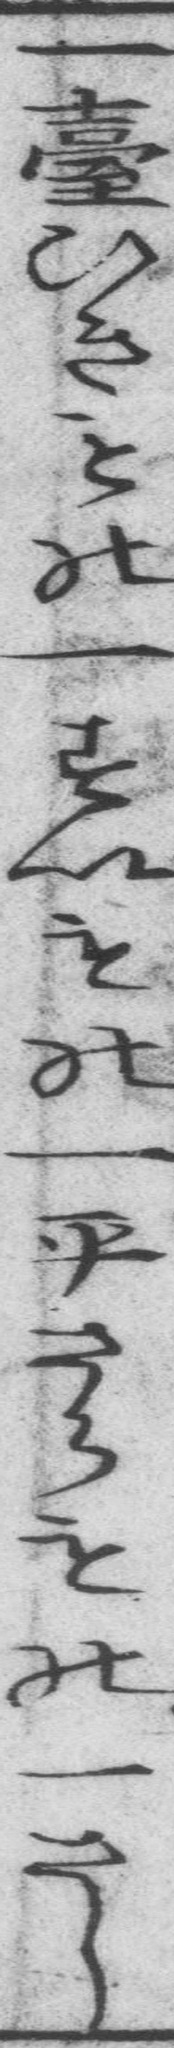一台ひきもの。一すいもの。一平さらもの。一さし
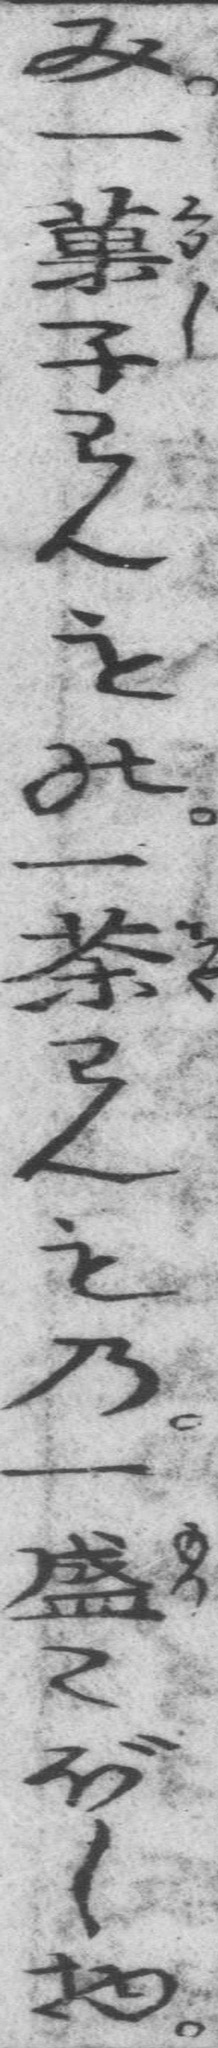み。一菓子わんもの。一茶わんもの。一盛こぼし物。
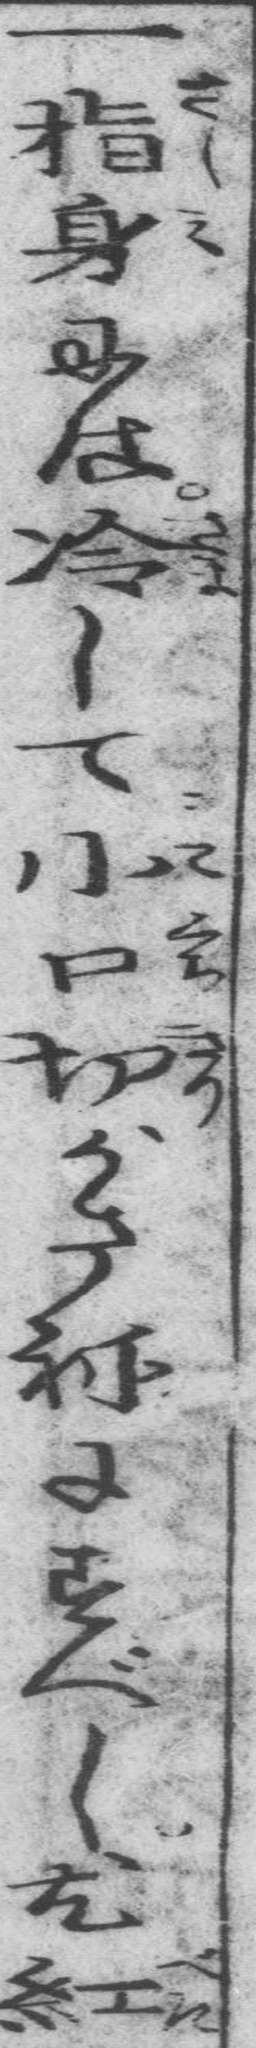一指身には。冷して。小口切かさねにすべし。尤紅
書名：萬寳料理秘密箱
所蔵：大阪府立大学学術情報センター 国文学研究資料館
